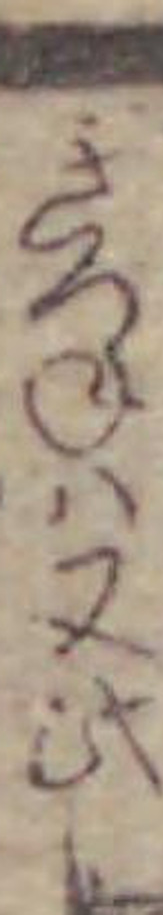きつねは又此
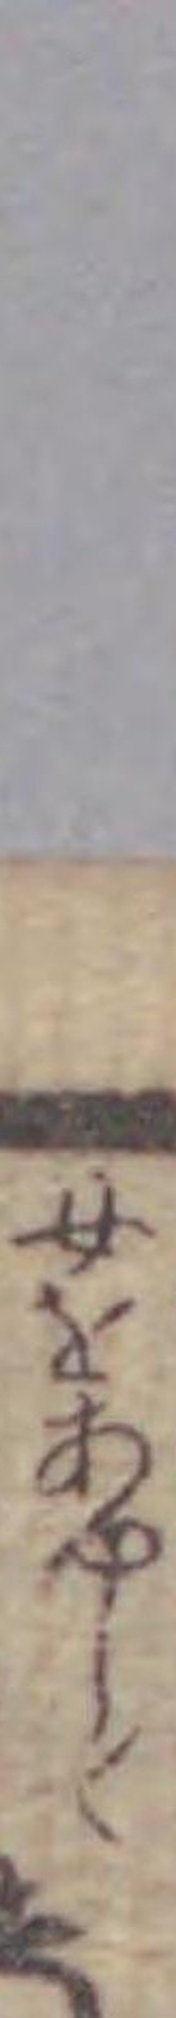女をあやしく
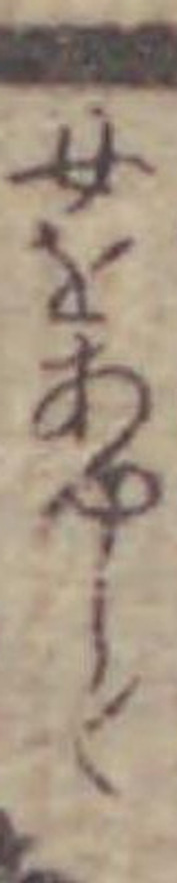女をあやしく
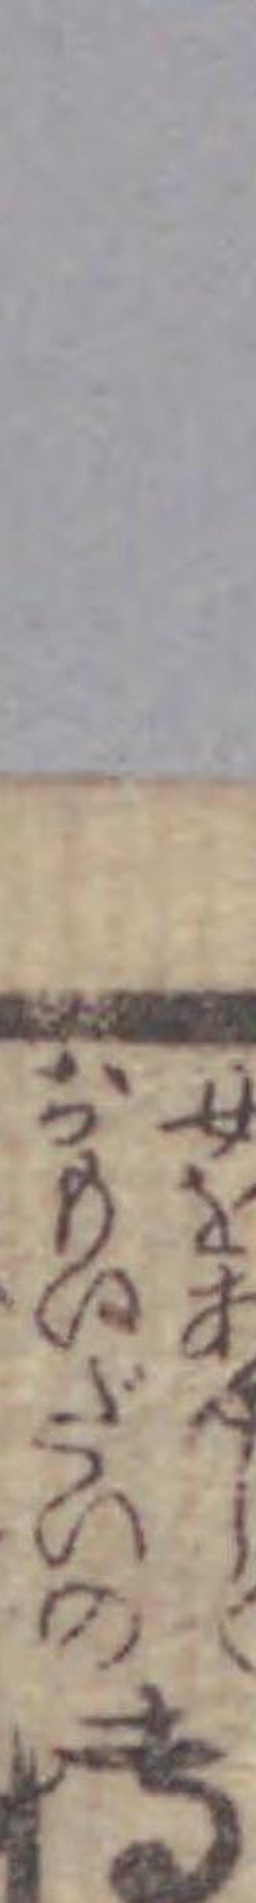おもいだいの
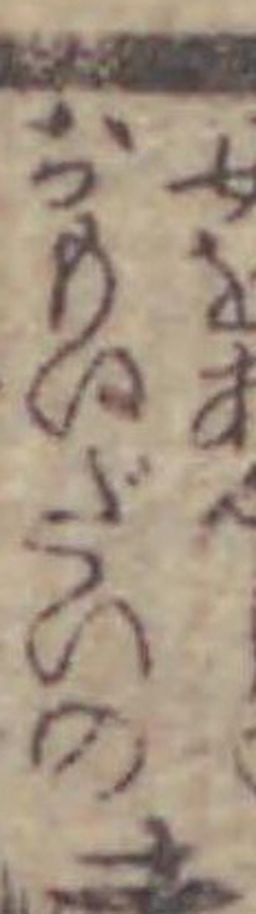おもいだいの
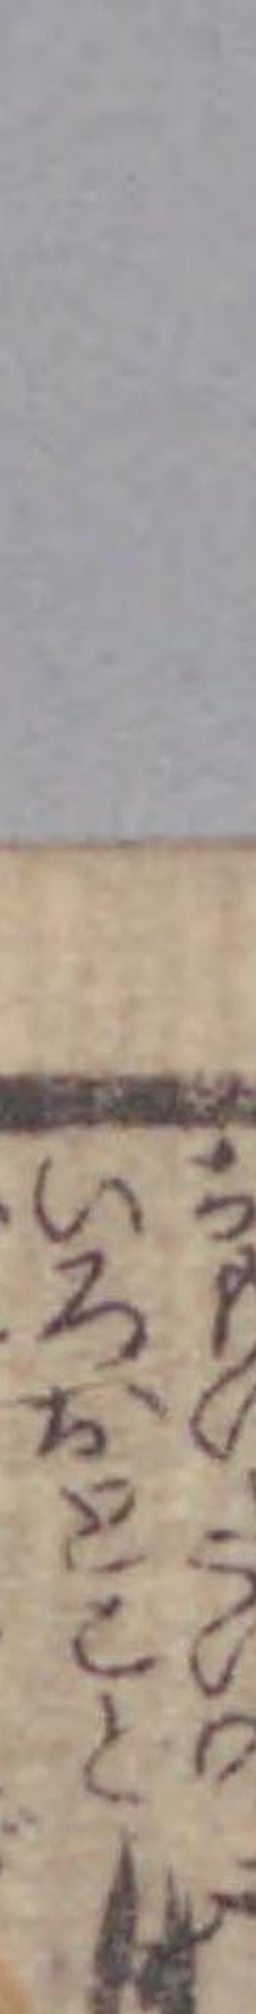いろおとこと
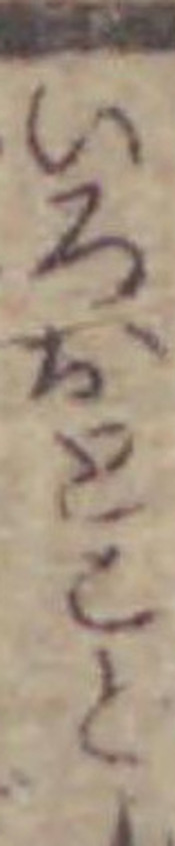いろおとこと
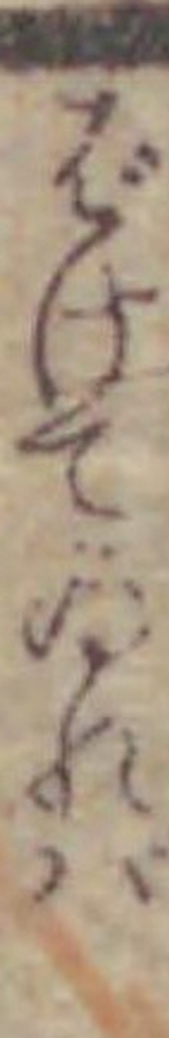ばけてゐれば
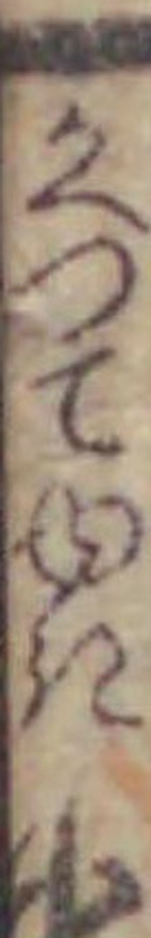かへつてゆき
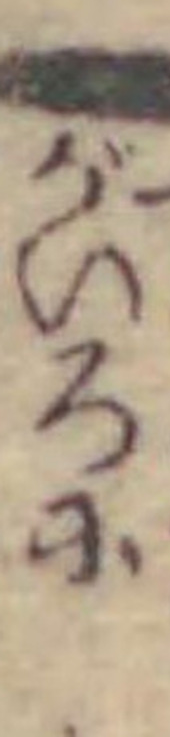がいろに
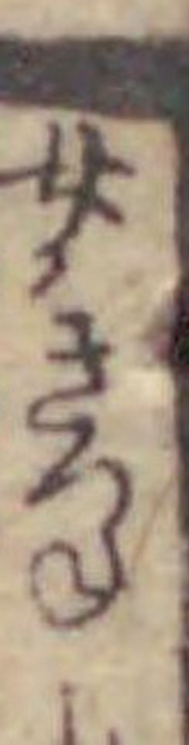女はきつね
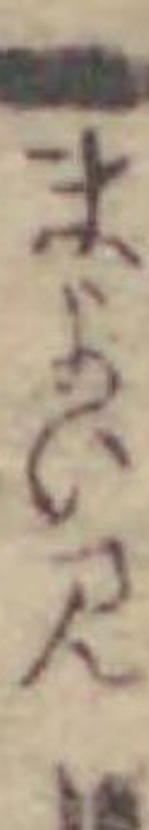まよい見
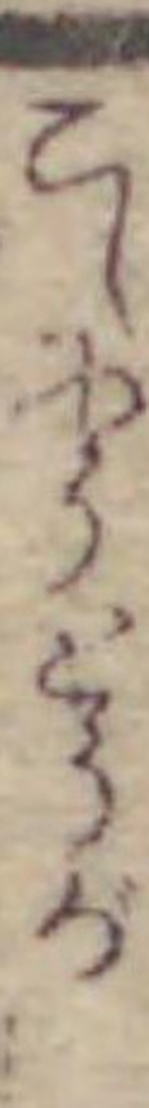こしにうとうが
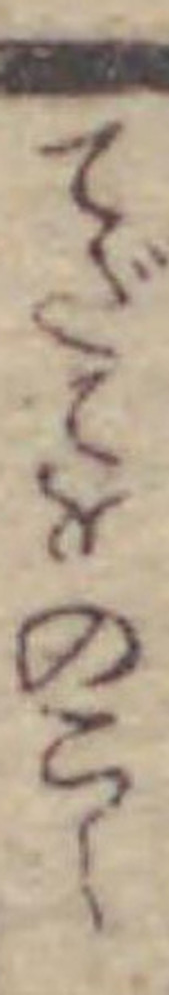てだてをのこら
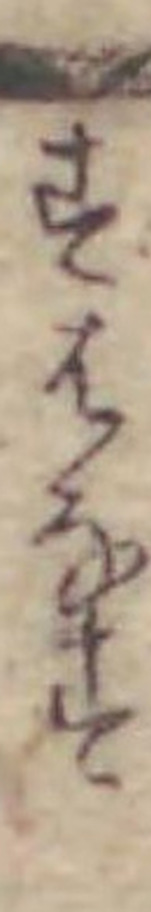すはなす
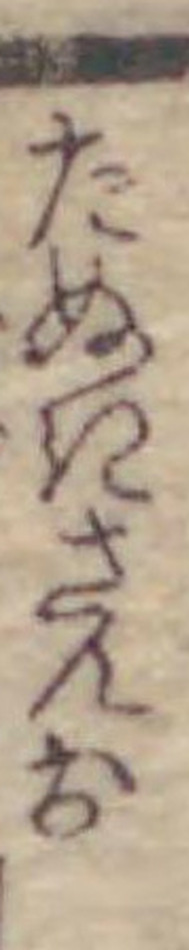たぬきさんお
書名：化物仲間破 : 2巻
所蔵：国立国会図書館 National Diet Library, JAPAN
